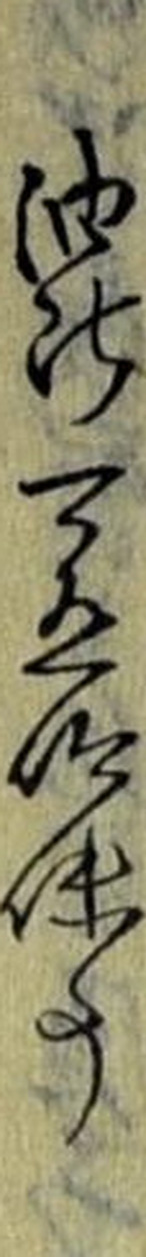油断可有吟味事
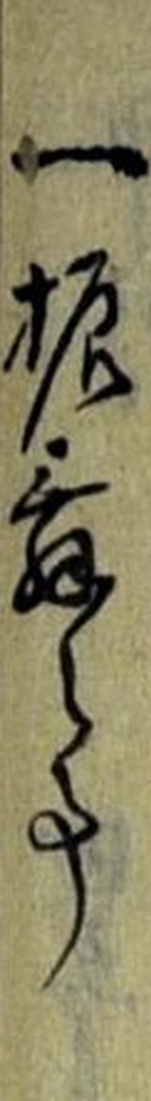一振舞之事
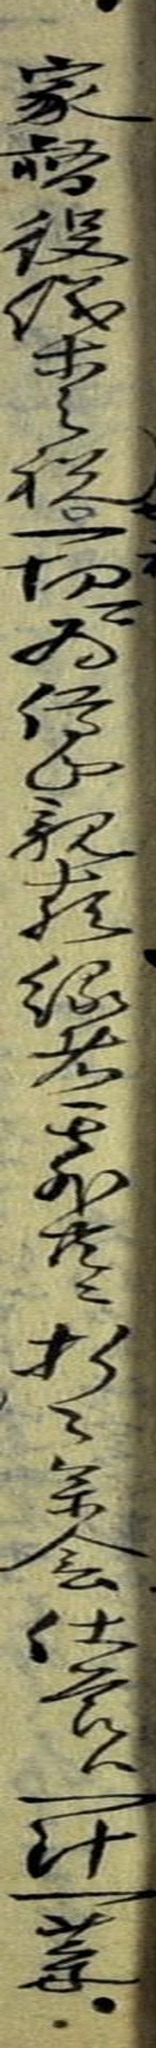家督役儀等之祝◦を初一切可為停止親類縁者其外共ニ折々参会仕節ハ一汁一菜
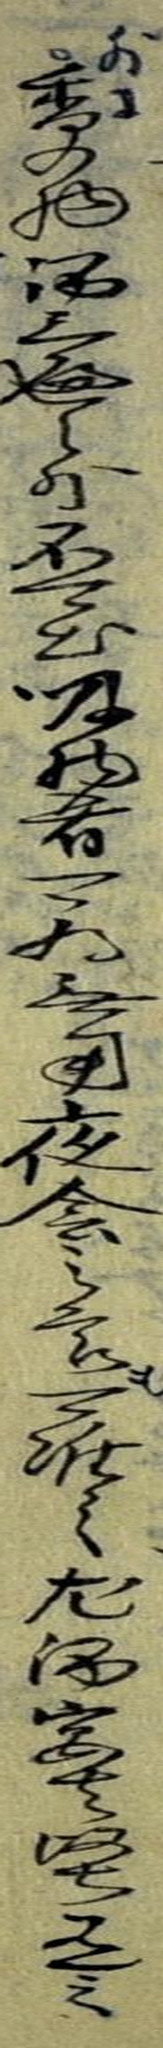◦外に香の物酒三遍之外不可出吸物肴可為無用夜会之節も可准之尤酒宴者堅有之
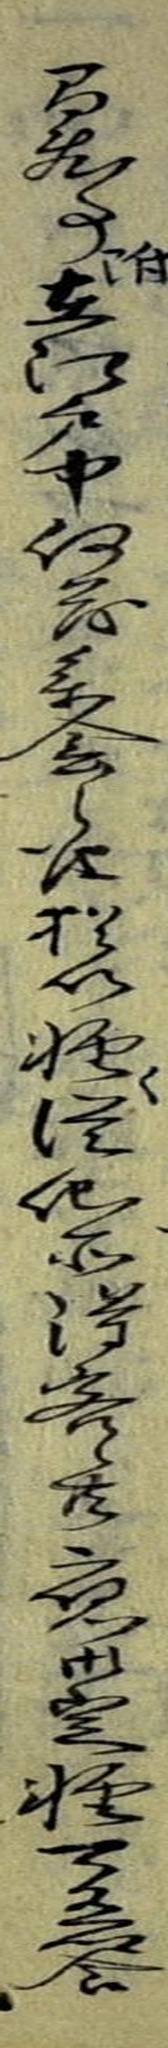間敷事附在江戸中何茂参会之儀猶以軽く従他所得客候共応御定軽可有饗
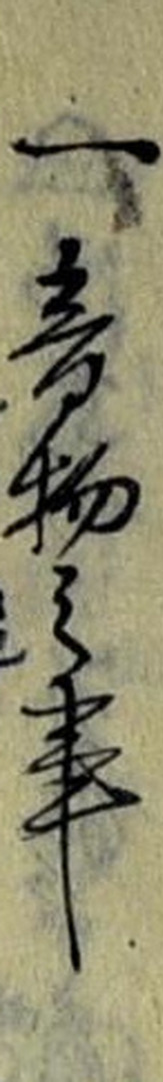一音物之事
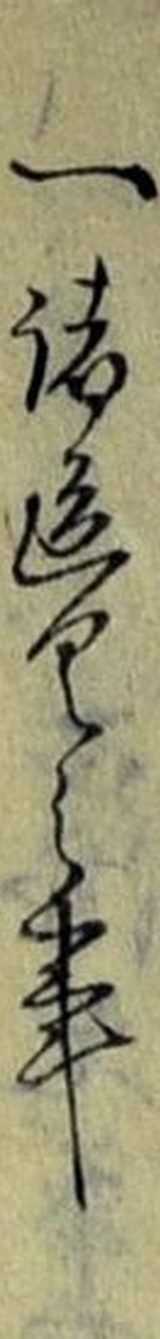一諸道具之事
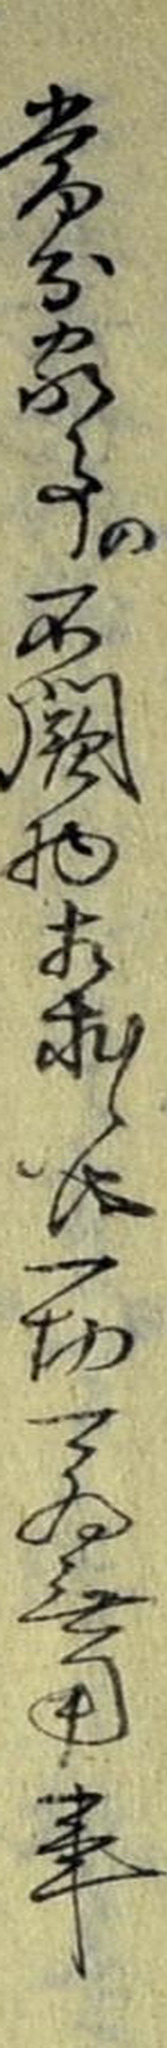当分家事の不闕物相求候儀一切可為無用事
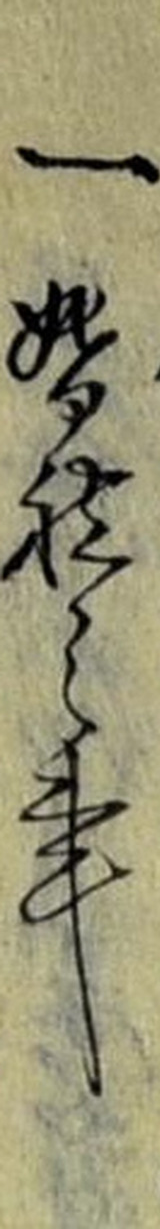一屋作之事
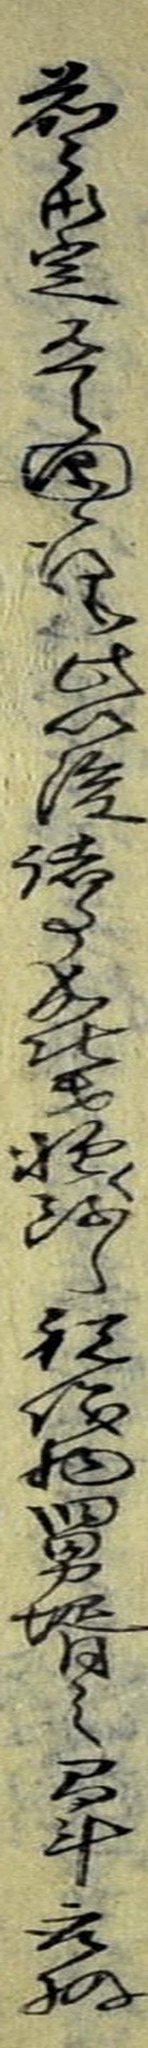前々御定有之儀候得共此以後諸事成次第軽く致候祝儀物舅婿之間斗取扱
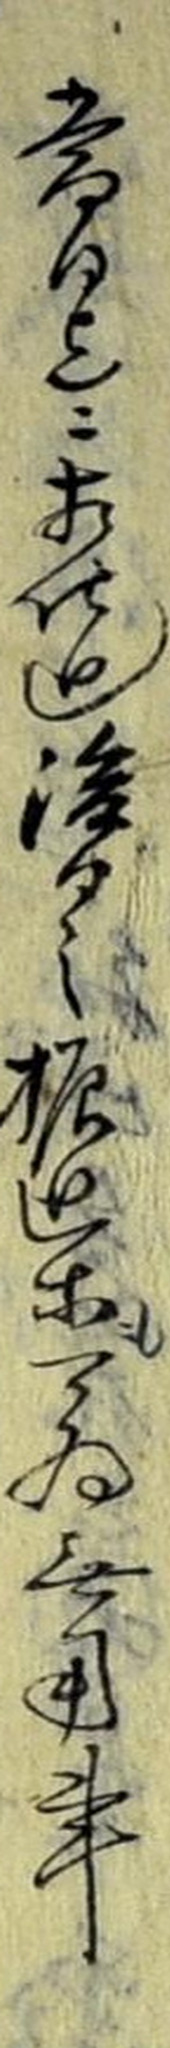当日迄ニ相仕廻後日之振廻等も可為無用事
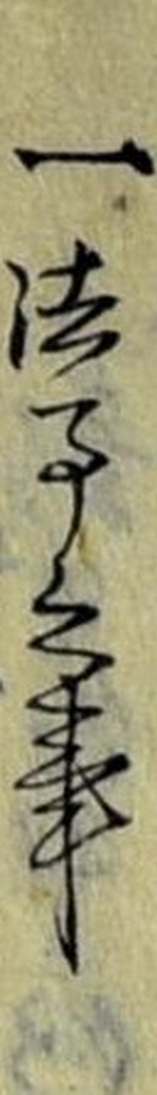一法事之事
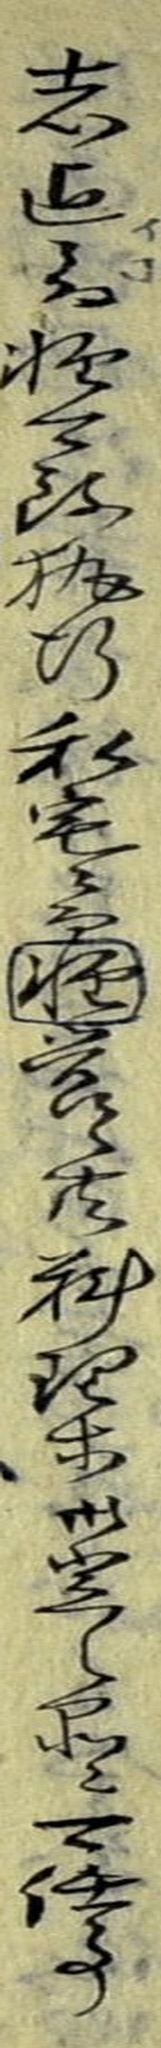志迄ニ而軽可致執行私宅ニ而軽営候共料理等御定之品ニ可任事
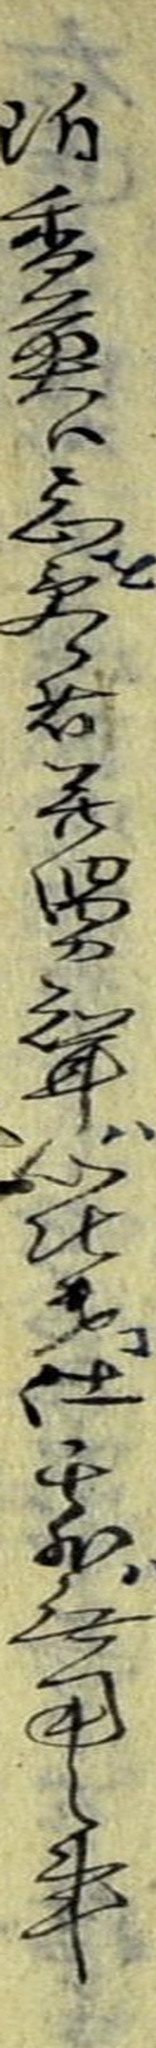附香奠ハ忌を受候者并舅聟ハ心次第に仕其外ハ無用之事
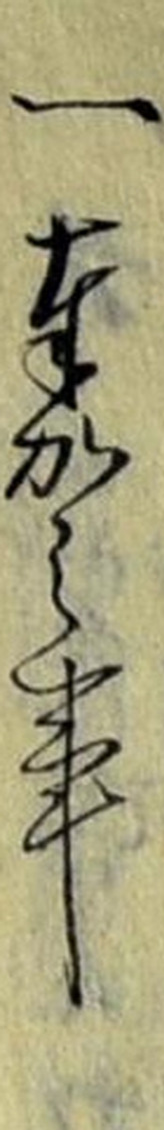一奉加之事

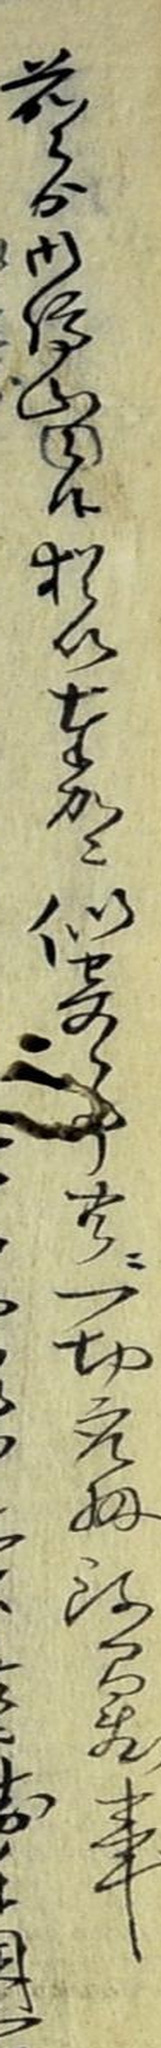前々ゟ御停止ニ候猶以奉加ニ似寄候事共ニ一切取扱致間敷事
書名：命令之部 一
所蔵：福井県文書館 Fukui Prefectural Archives
